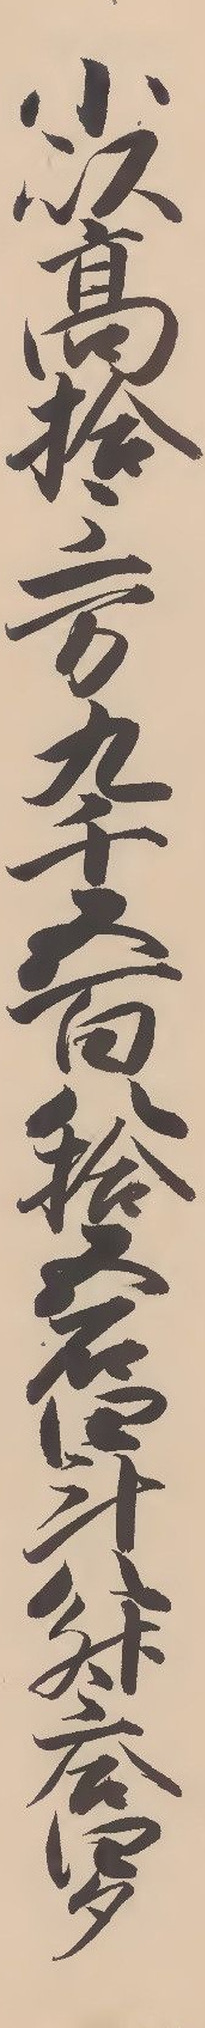小以高拾三万九千五百八拾五石四斗八升三合四勺
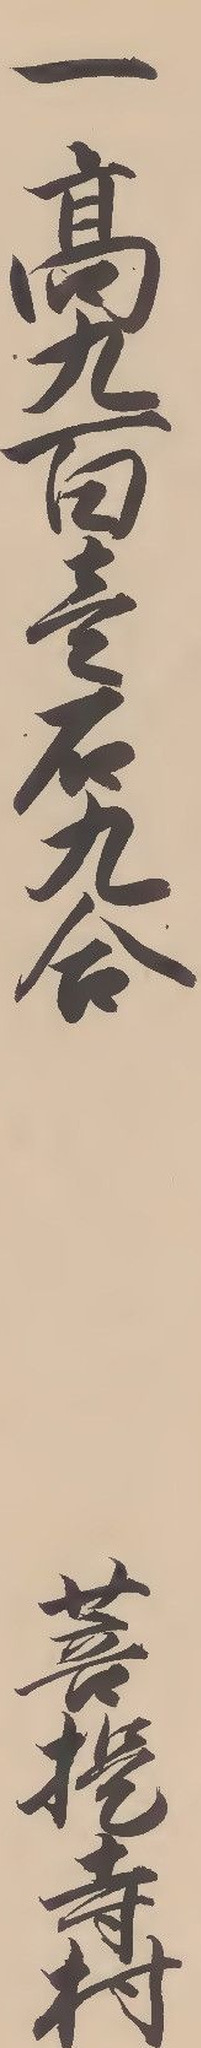一高九百壱石九合菩提寺村
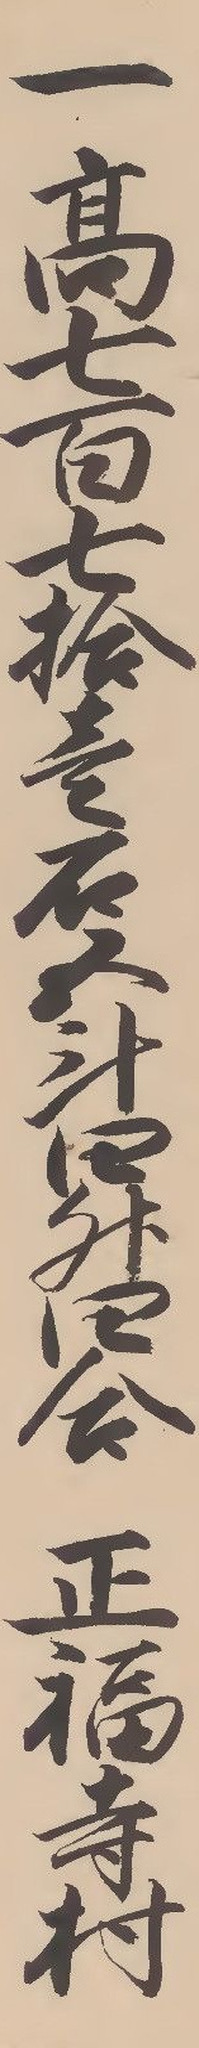一高七百七拾壱石五斗四升四合正福寺村
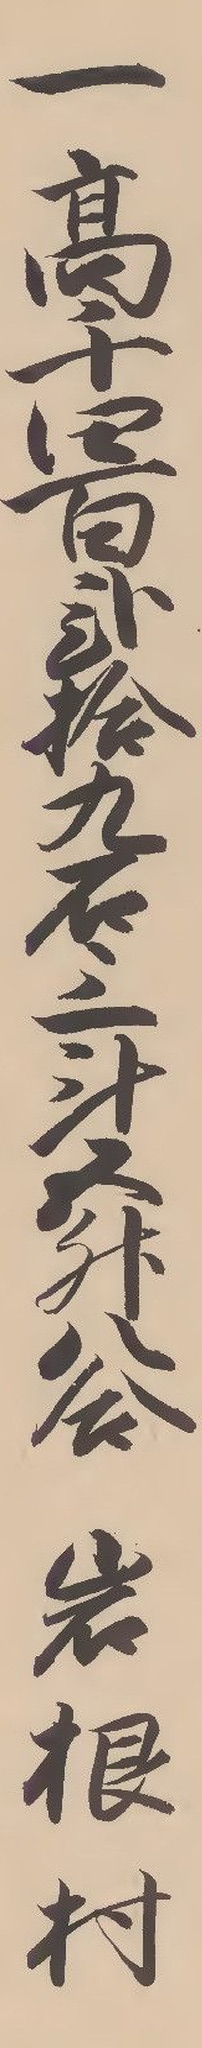一高千四百弐拾九石三斗五升八合岩根村

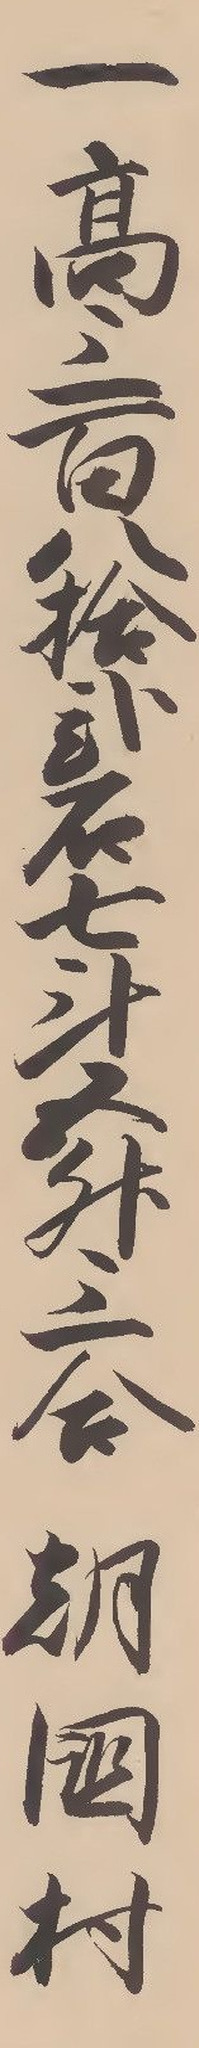一高三百八拾弐石七斗五升三合朝国村
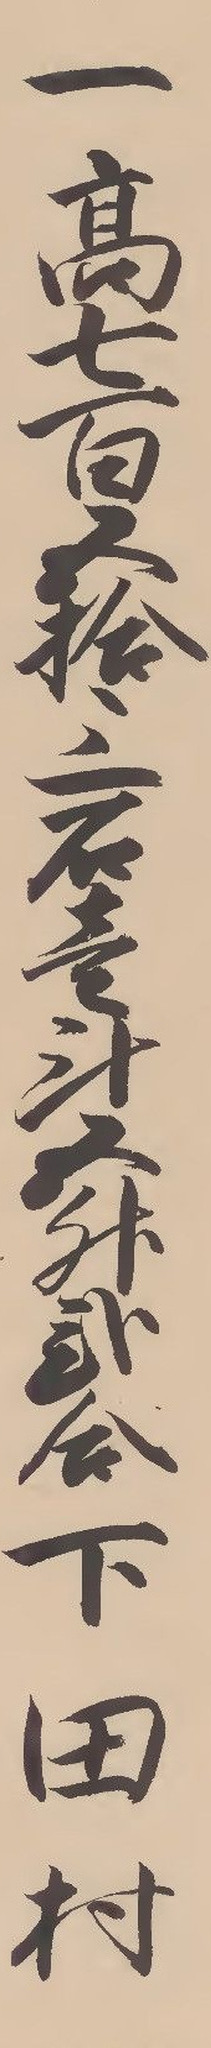一高七百五拾三石壱斗五升弐合下田村
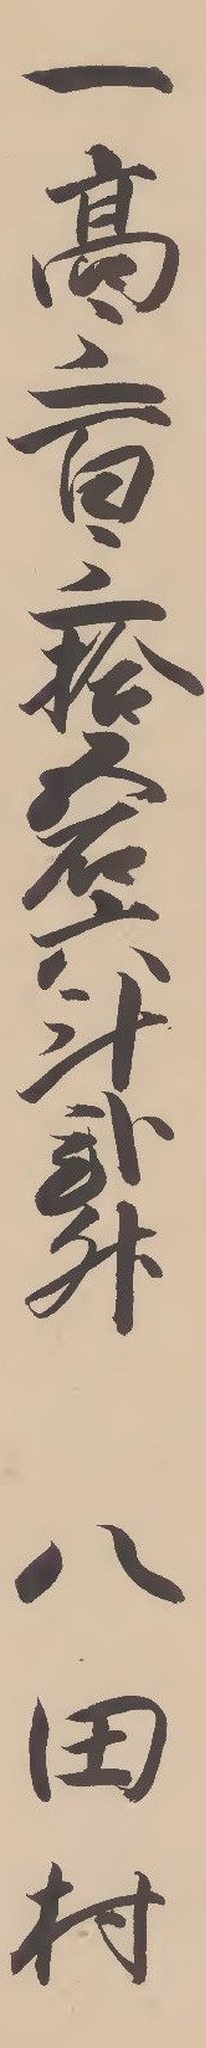一高三百三拾五石六斗弐升八田村
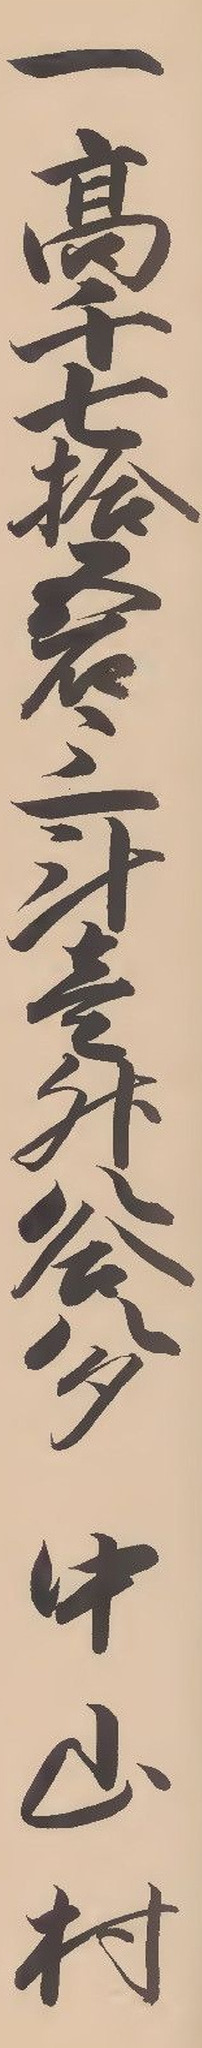一高千七拾五石三斗壱升八合八勺中山村
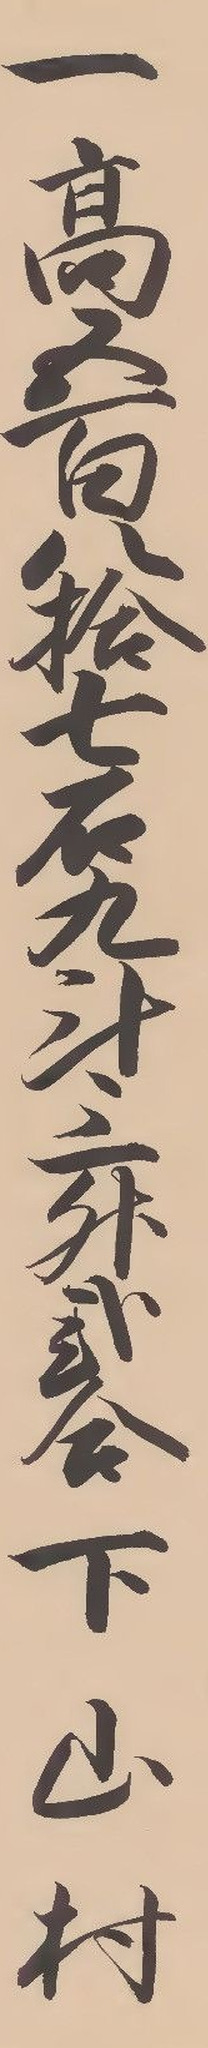一高五百八拾七石九斗三升弐合下山村
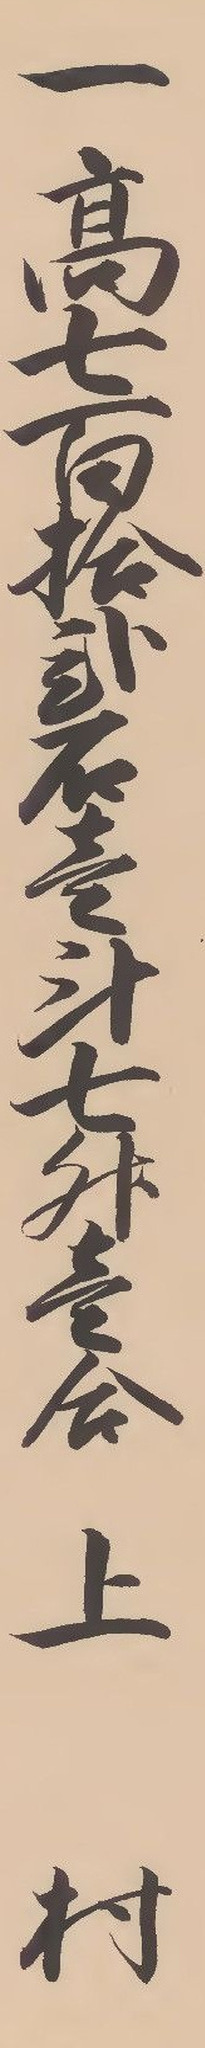一高七百拾弐石壱斗七升壱合上村
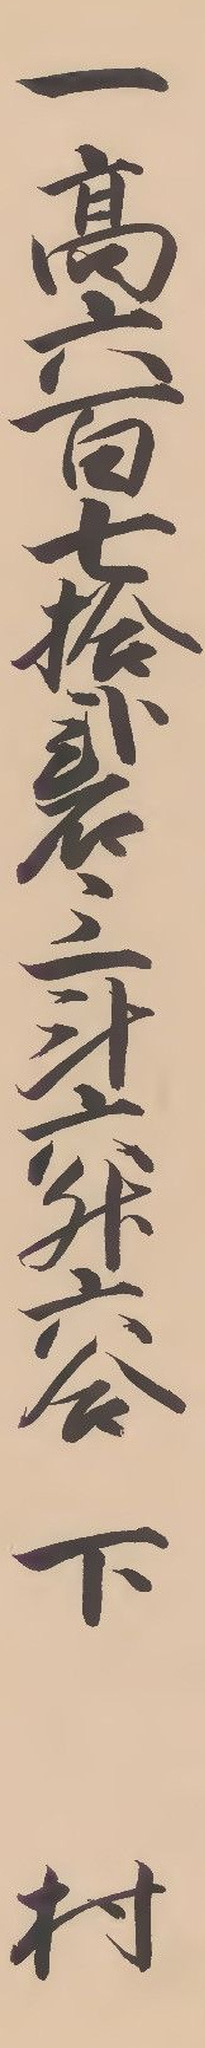一高六百七拾弐石三斗六升六合下村

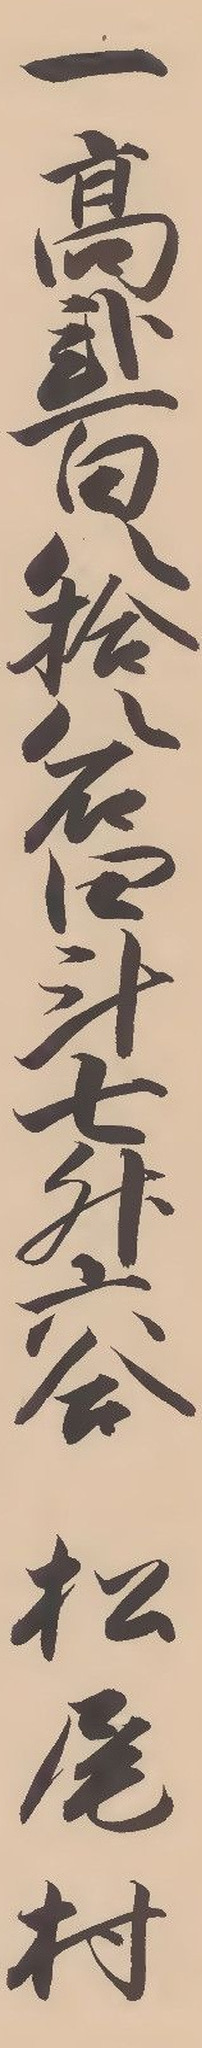一高弐百八拾八石四斗七升六合松尾村
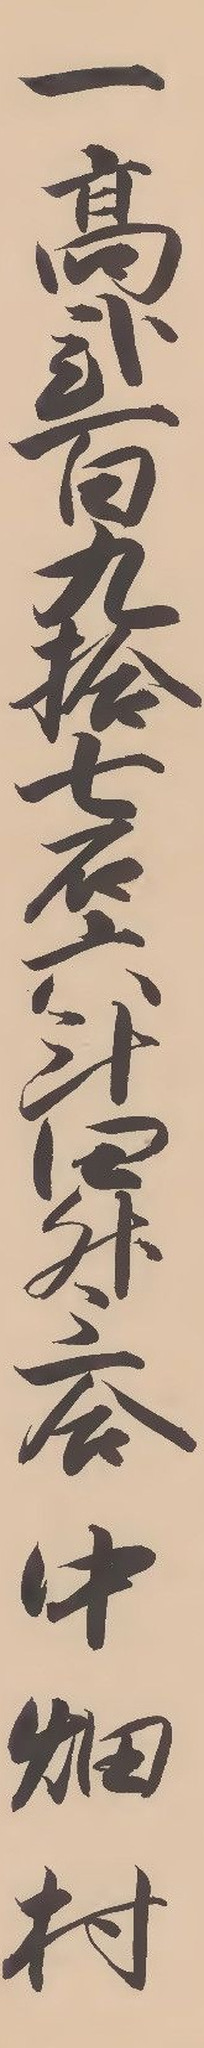一高弐百九拾七石六斗四升三合中畑村
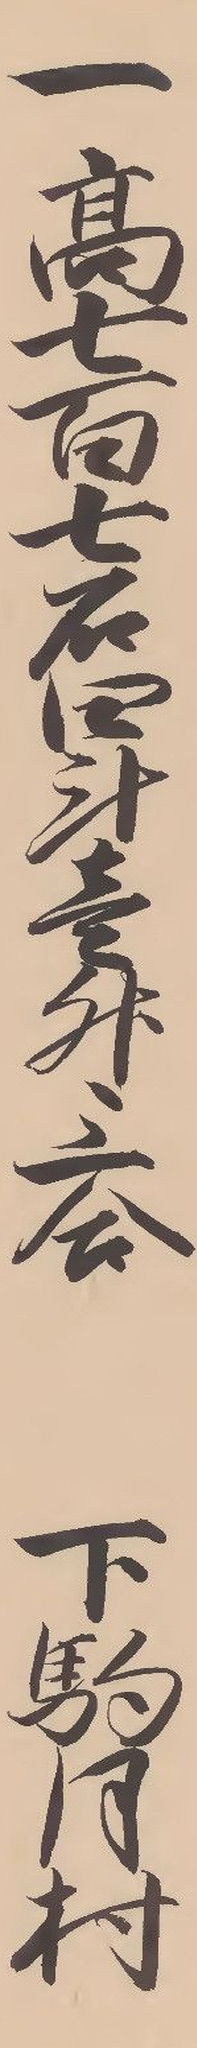一高七百七石四斗壱升三合下駒月村
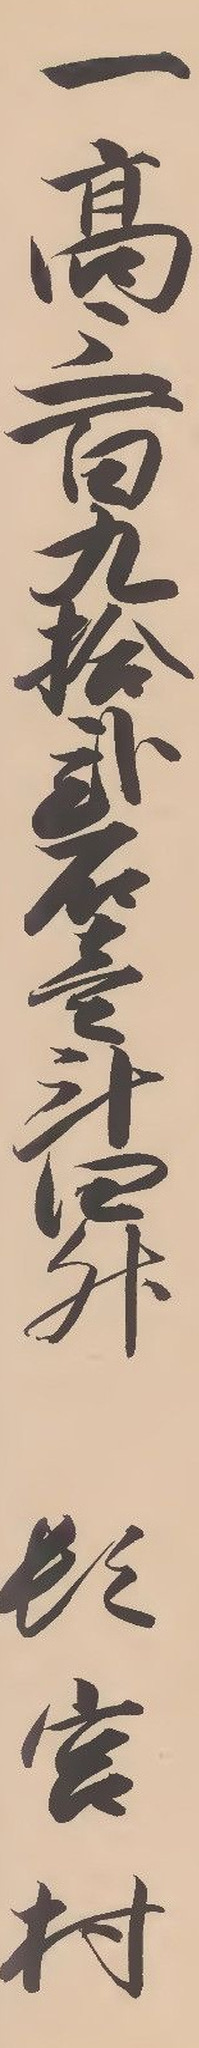一高三百九拾弐石壱斗四升頓宮村
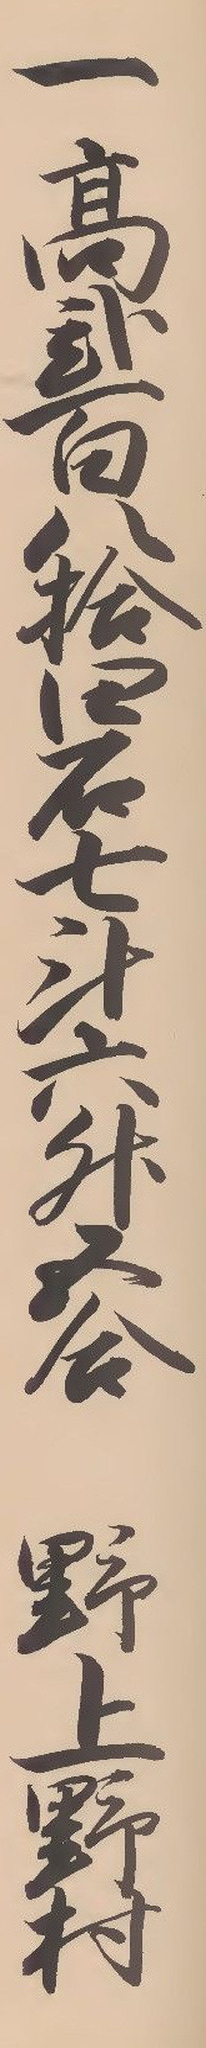一高弐百八拾四石七斗六升五合野上野村
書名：近江国郷帳
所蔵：国立公文書館 National Archives of Japan
